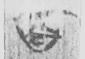百
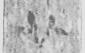廿
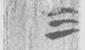三
